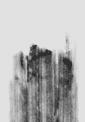女
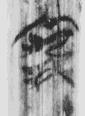{宀九又}
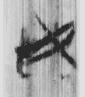女
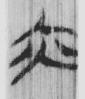亦
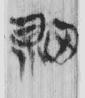則
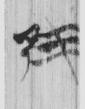隹
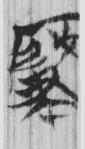肈
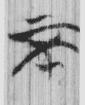不
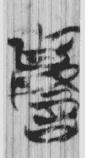{言妻}
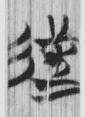逆
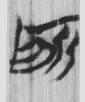所
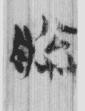朕
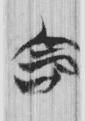命
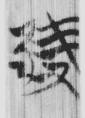蒦
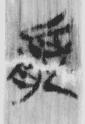{月頁}
